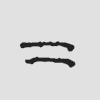二
